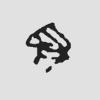胃
